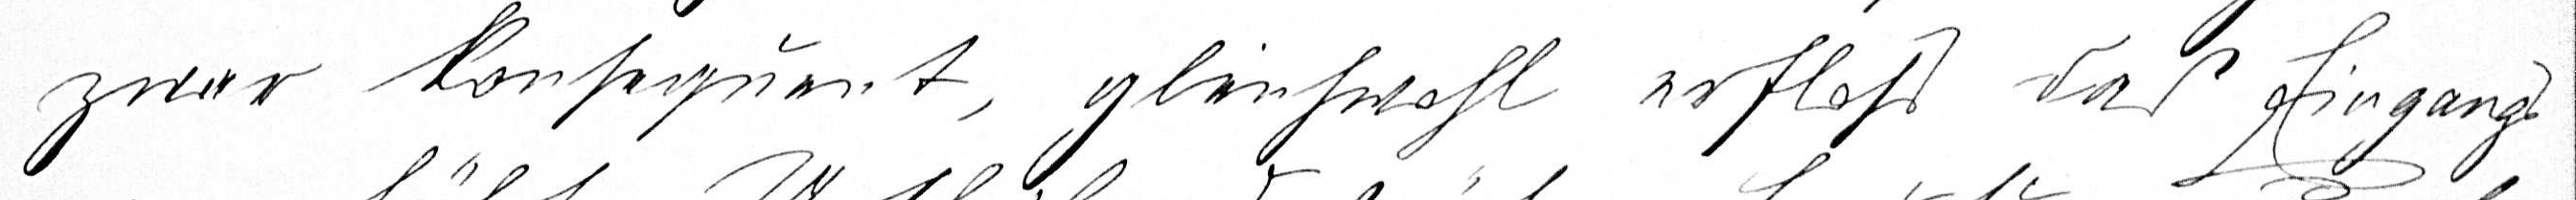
zwar konsequent, gleichwohl erfloß das Eingang
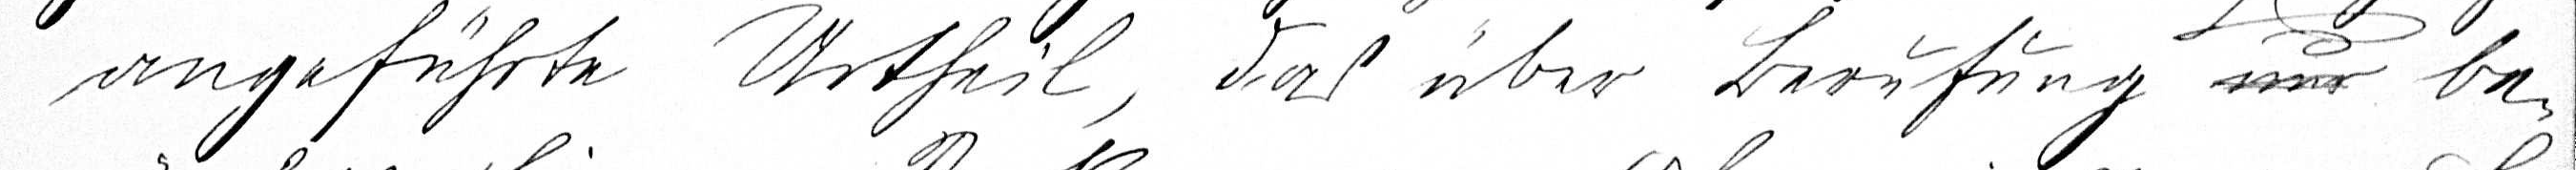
angeführte Urtheil, das über Berufung be¬
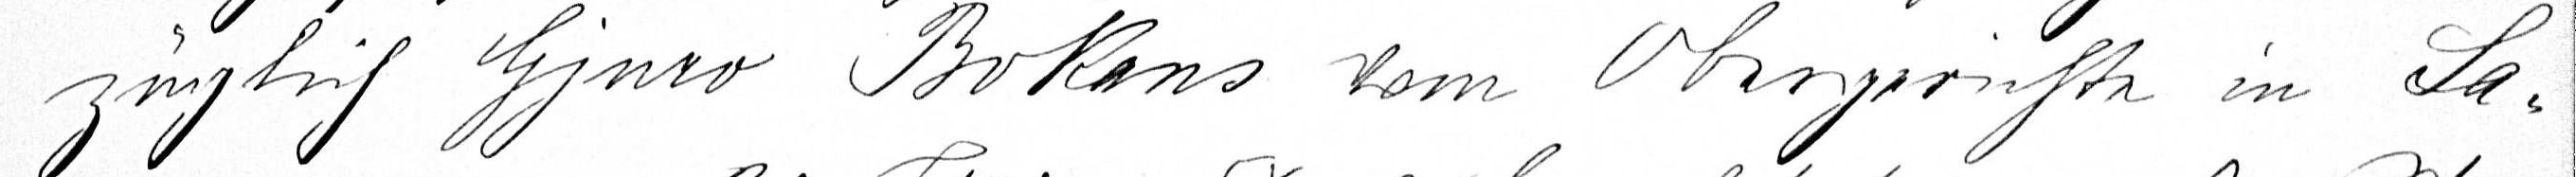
züglich Gjuro Bokans vom Obergerichte in Sa¬
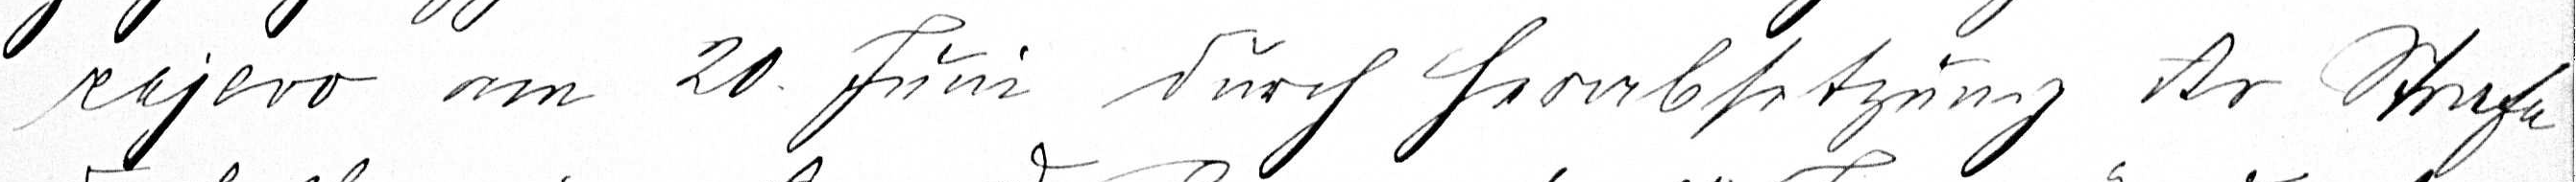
rajevo am 20. Juni durch herabsetzung der Strafe
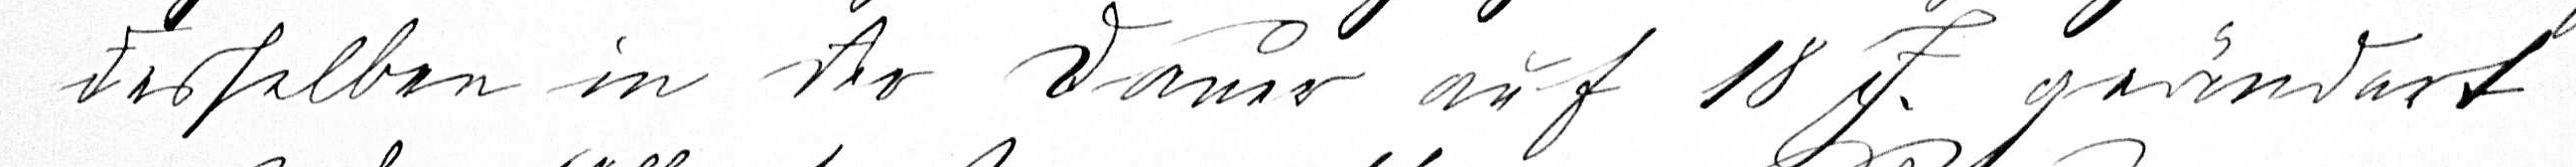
desselben in der Dauer auf 18 J. geändert
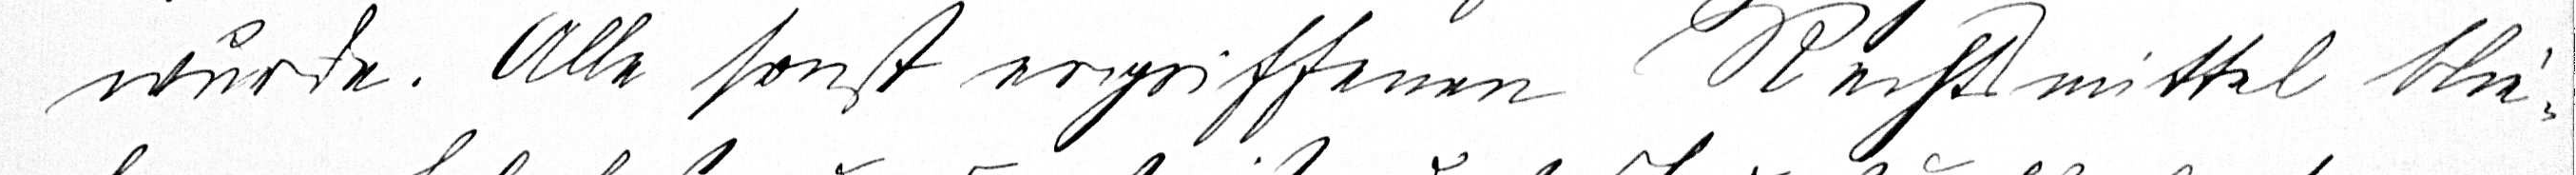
wurde. Alle sonst ergriffenen Rechtsmittel blie¬
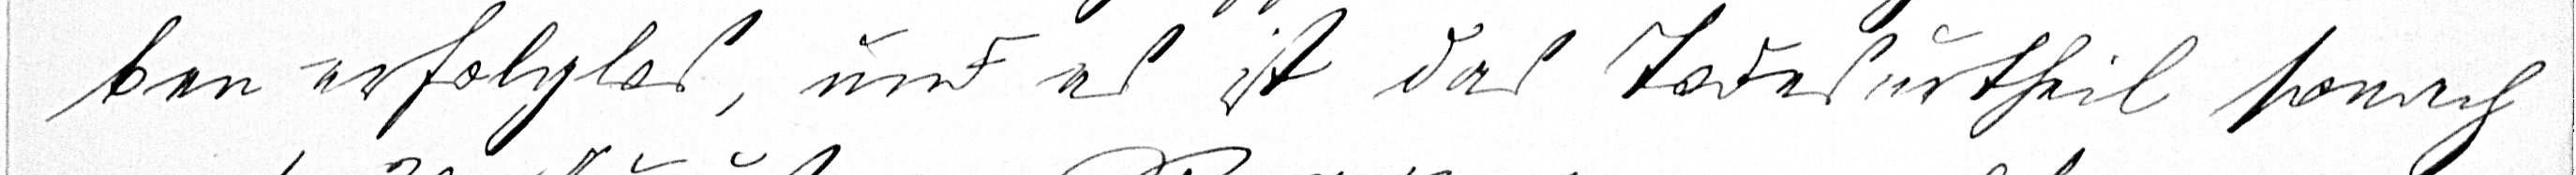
ben erfolglos, und des ist das Todesurtheil sonach
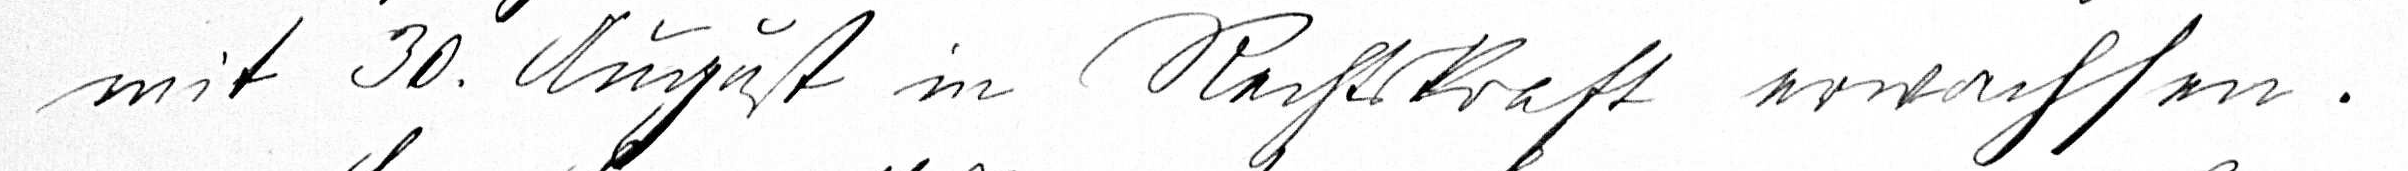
mit 30. August in Rechtskraft erwachsen.
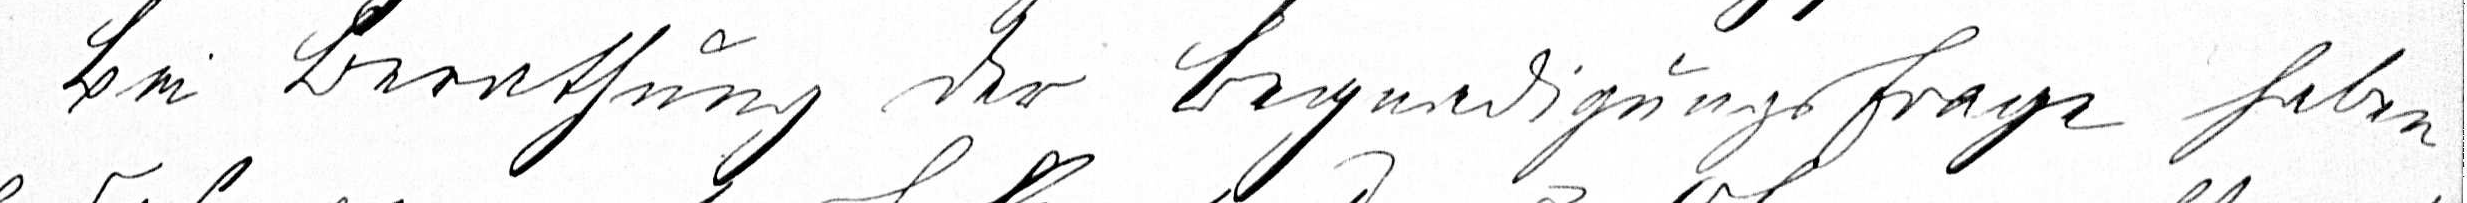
Bei Berathung der Begnadigungsfrage haen
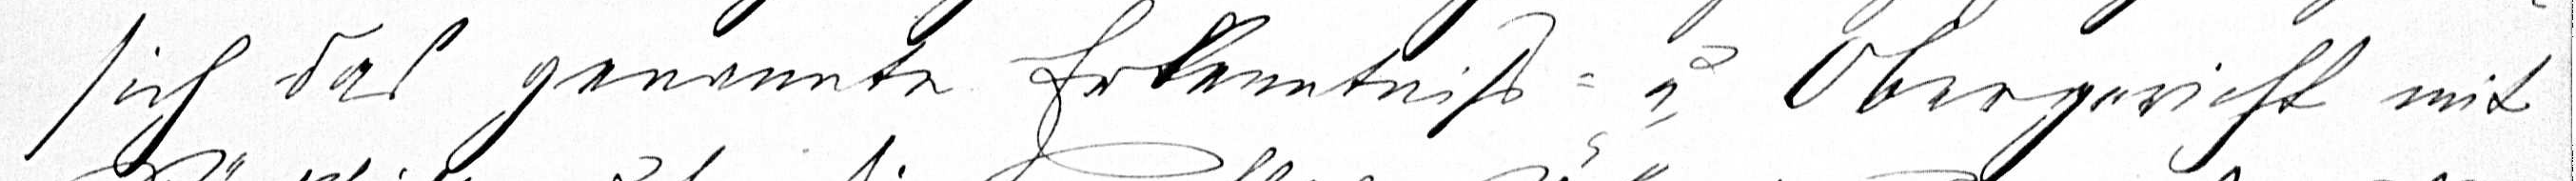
sich das genannte Erkenntniß- u. Obergericht mit
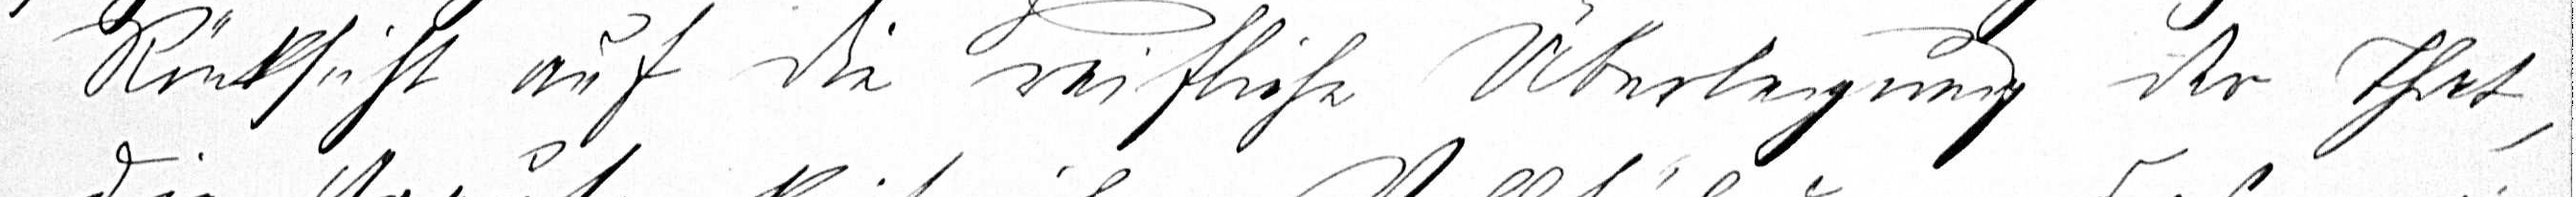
Rücksicht auf die reifliche Überlegung der That,
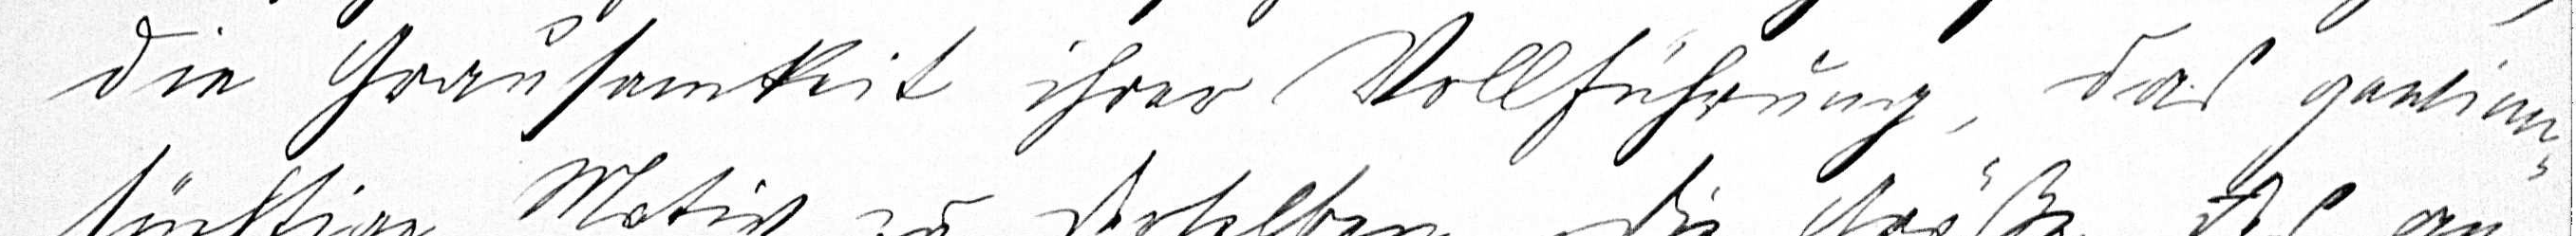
die Grausamkeit ihrer Vollführung, das gewinn¬
